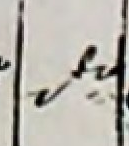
Do
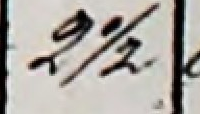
2 1/2
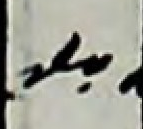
Do
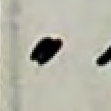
„
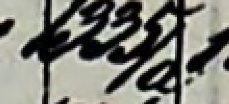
1335/a
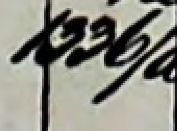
1336/a
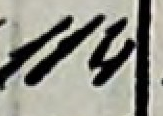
114
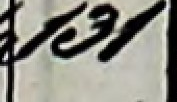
131
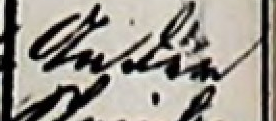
An der
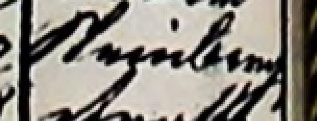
Steinberg
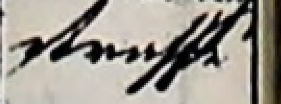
strasse
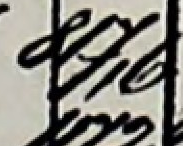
817,6
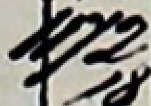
1172,8
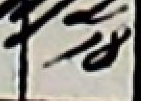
390,4
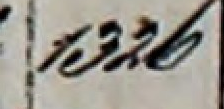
1326
